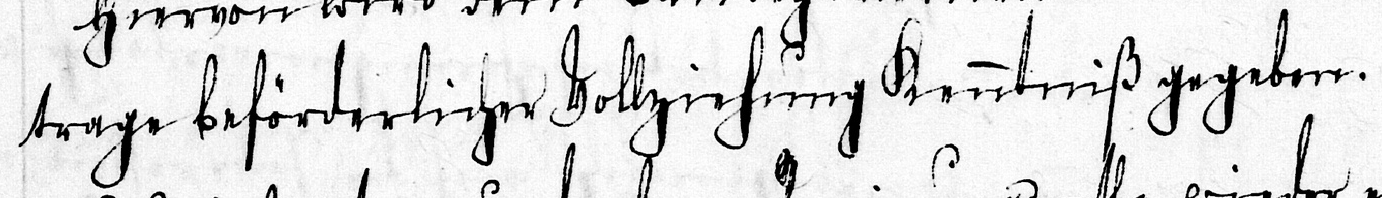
trage beförderlicher Vollziehung Kenntniß gegeben.
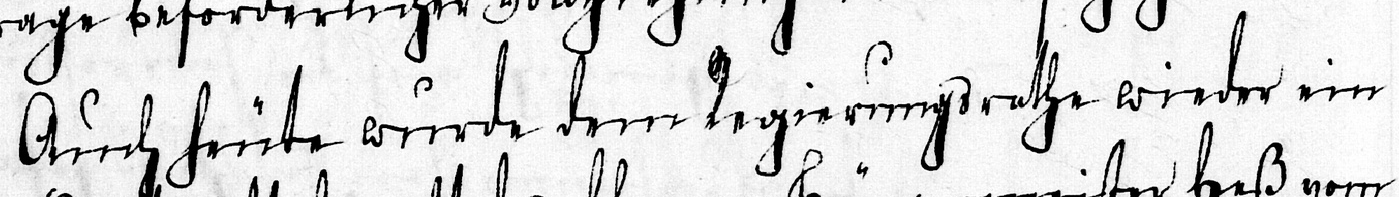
Auch heute wurde dem Regierungsrathe wieder ein
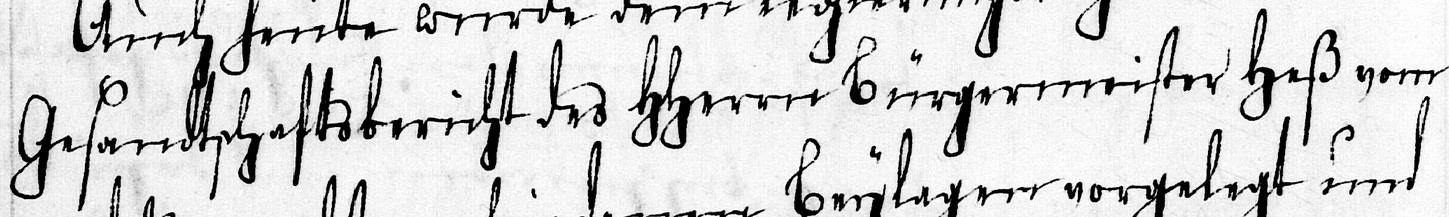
Gesandtschaftsbericht des HHerrn Bürgermeister Heß vom
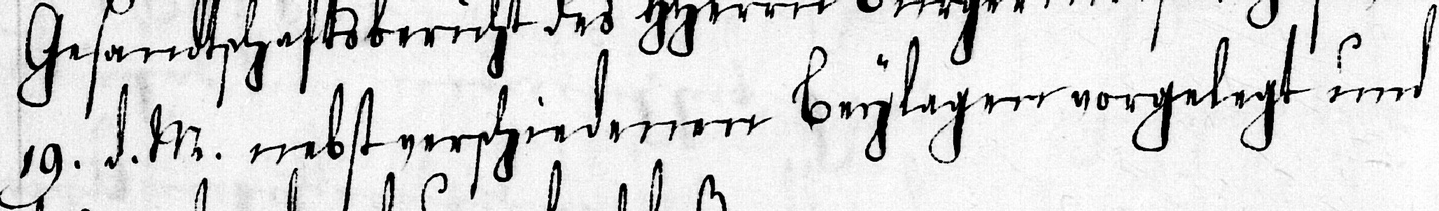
19. d. M. nebst verschiedenen Beylagen vorgelegt und
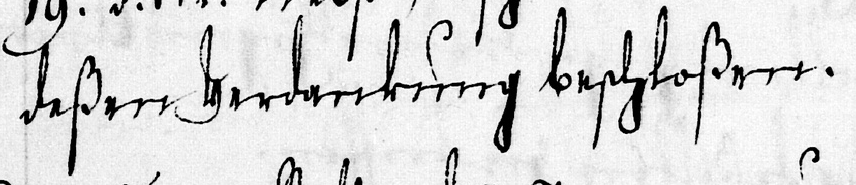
deßen Verdankung beschloßen.
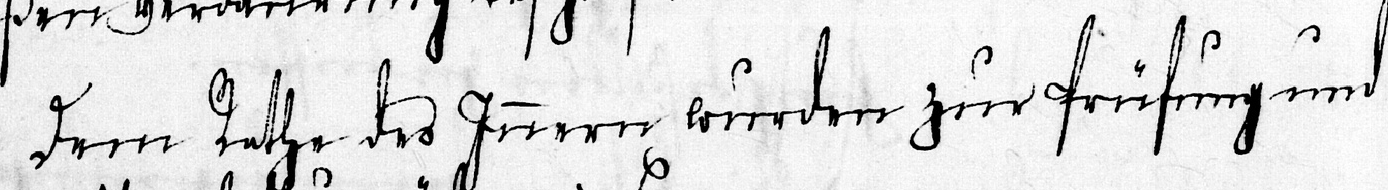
Dem Rathe des Innern wurden zur Prüfung und
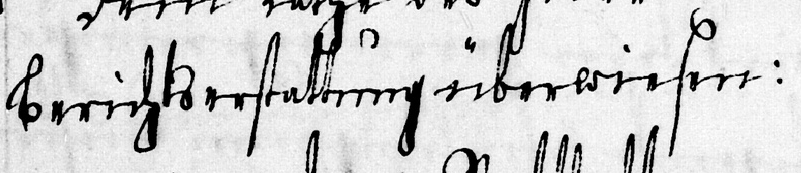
Berichtserstattung überwiesen:
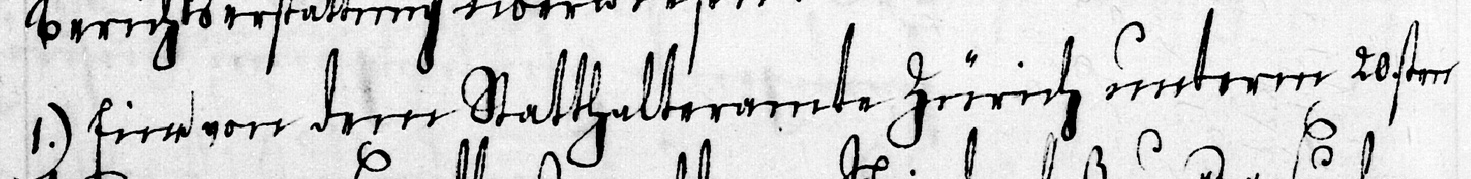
1.) Eine von dem Statthalteramte Zürich unterm 20sten
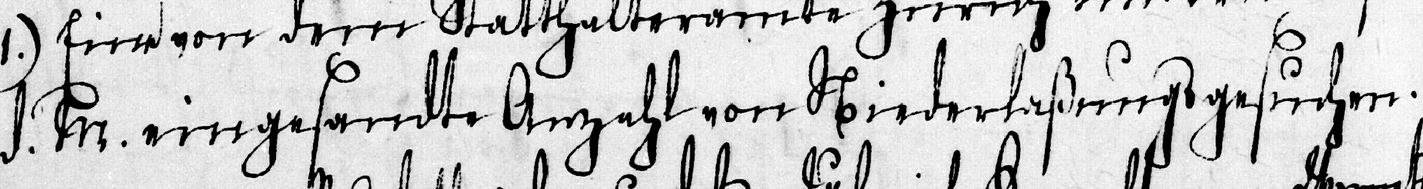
d. M. eingesandte Anzahl von Niederlaßungsgesuchen.
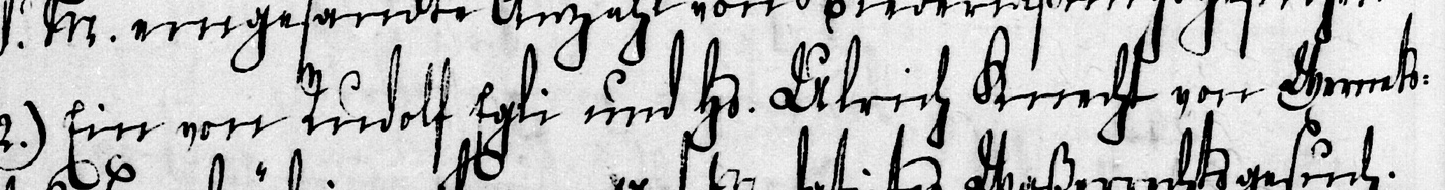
Ein von Rudolf Egli und Hs. Ulrich Knecht von Wermet¬
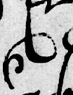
2.)
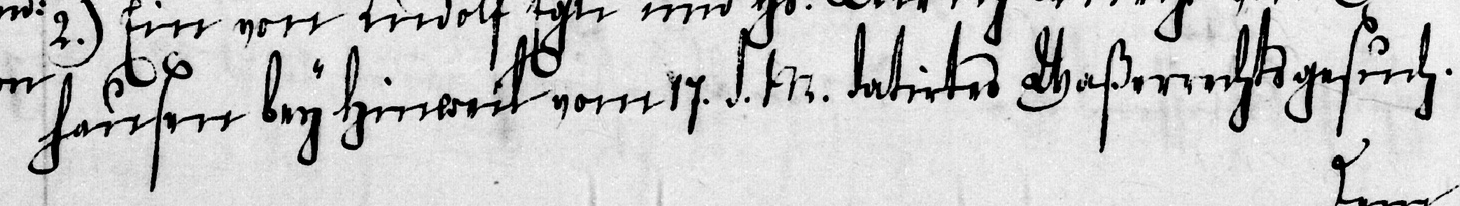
shausen bey Hinweil vom 17. d. M. datirtes Waßerrechtsgesuch.
